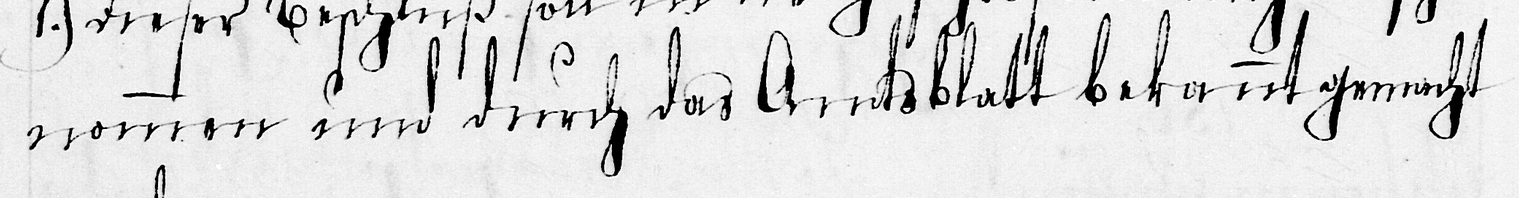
nommen und durch das Amtsblatt bekannt gemacht
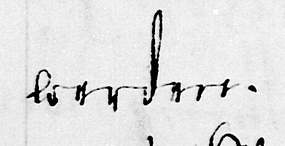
werden.
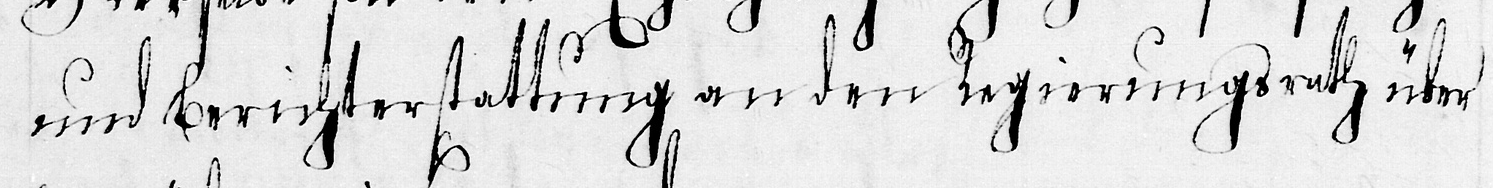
und Berichterstattung an den Regierungsrath über
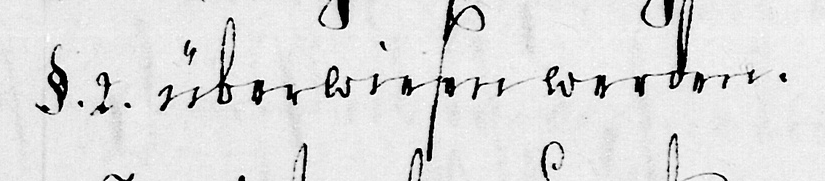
§. 2. überwiesen werden.
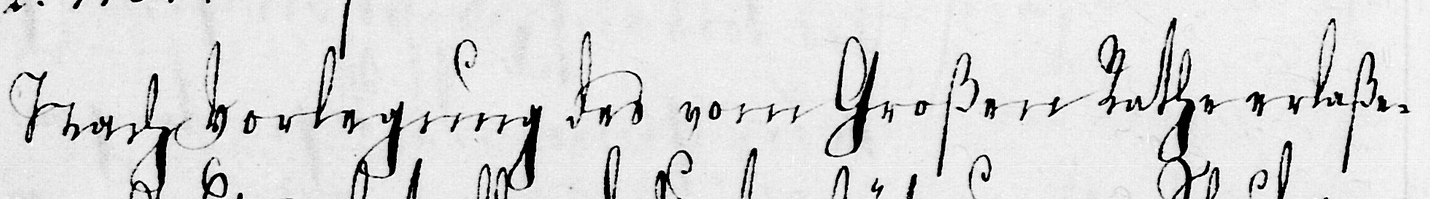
Nach Vorlegung des vom Großen Rathe erlaße¬
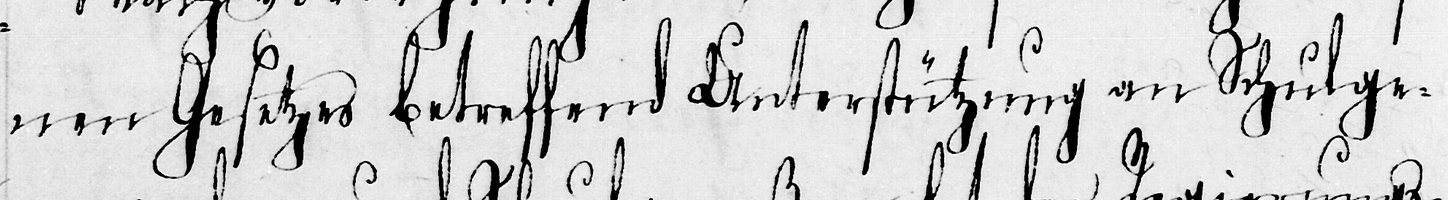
nen Gesetzes betreffend Unterstützung an Schulge¬
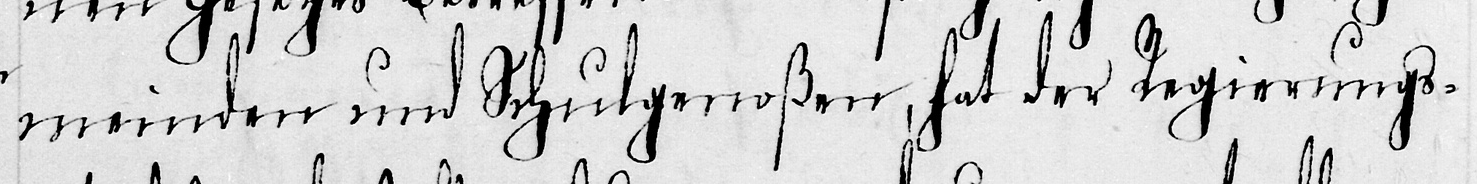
meinden und Schulgenoßen, hat der Regierungs¬
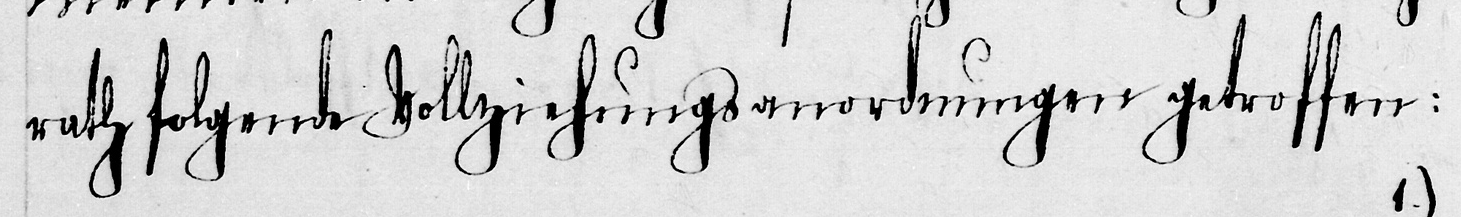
rath folgende Vollziehungsanordnungen getroffen:
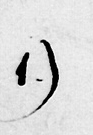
2.)
